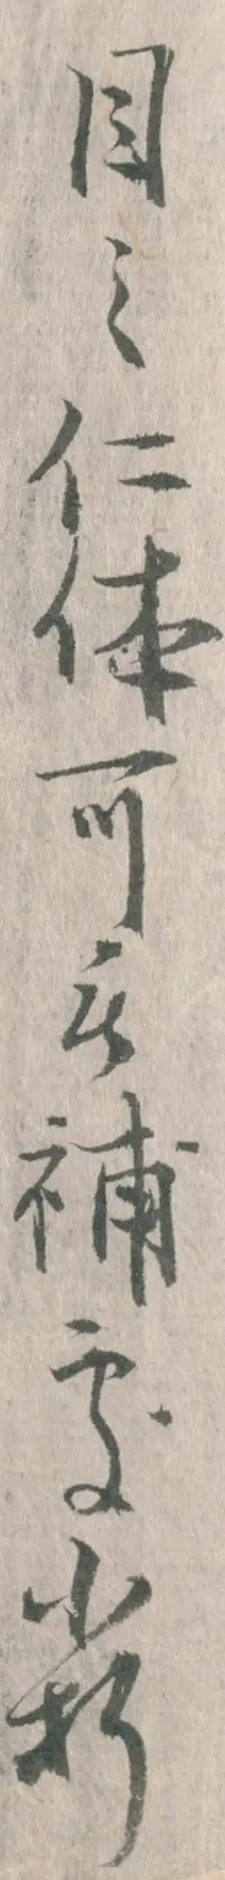目之仁体可被補處小折
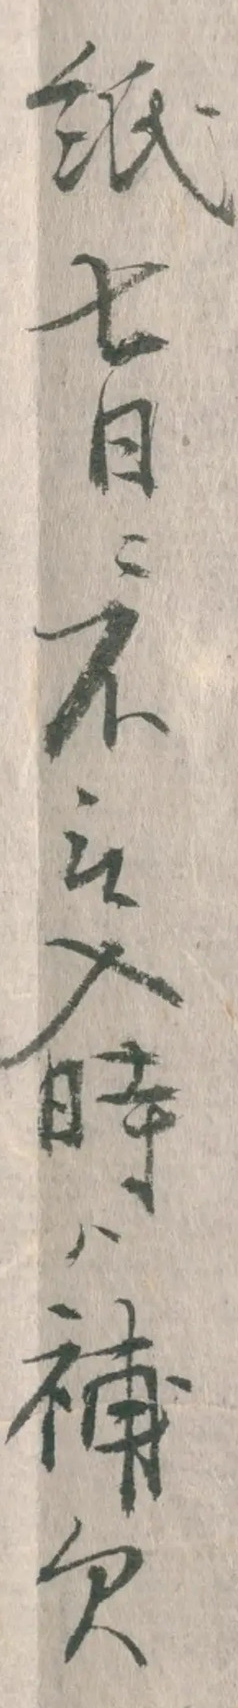紙七日ニ不被入時ハ補欠
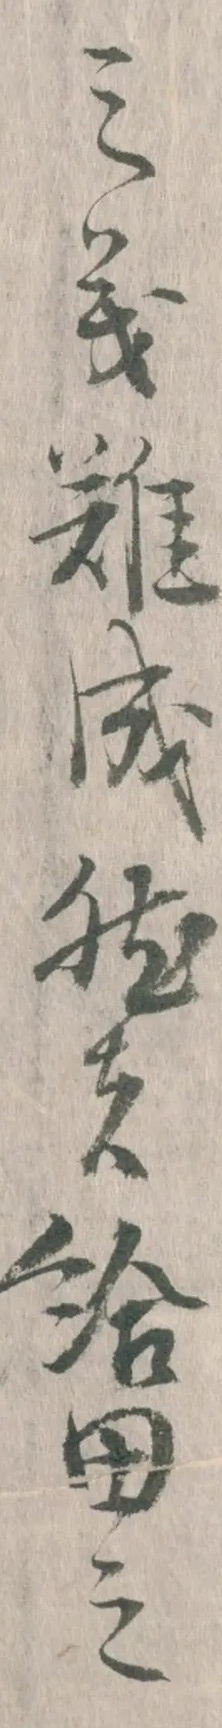之義難成然は給田之
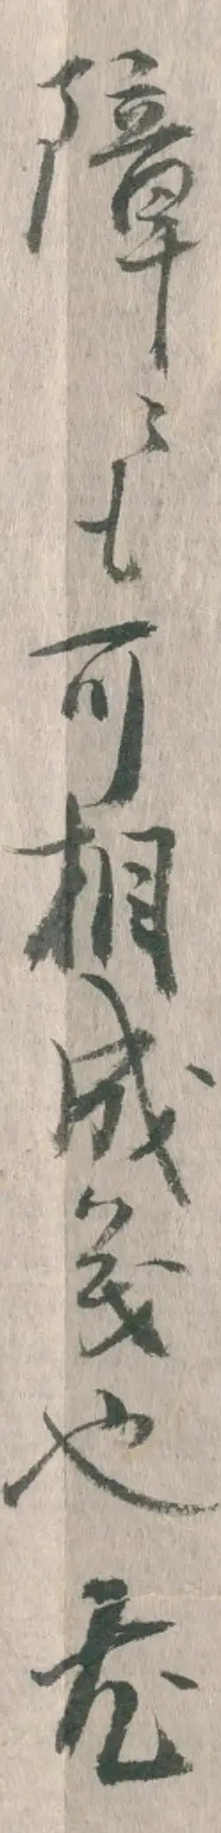障ニも可相成義也尤
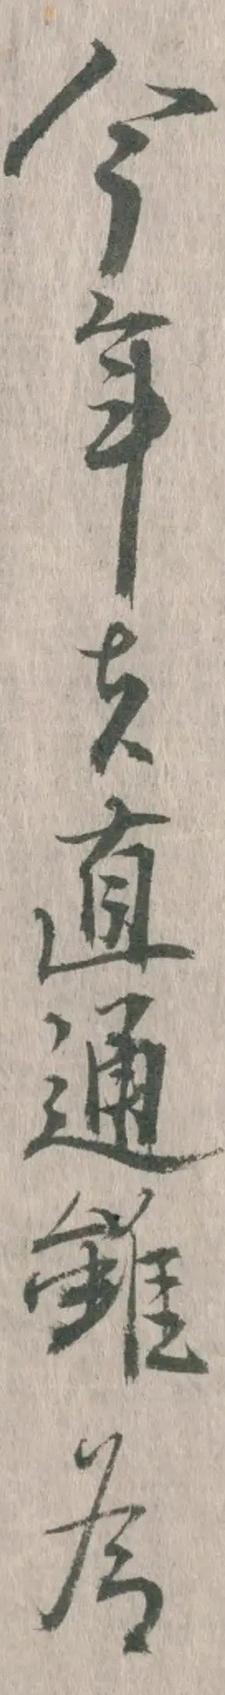今年は直通雖為
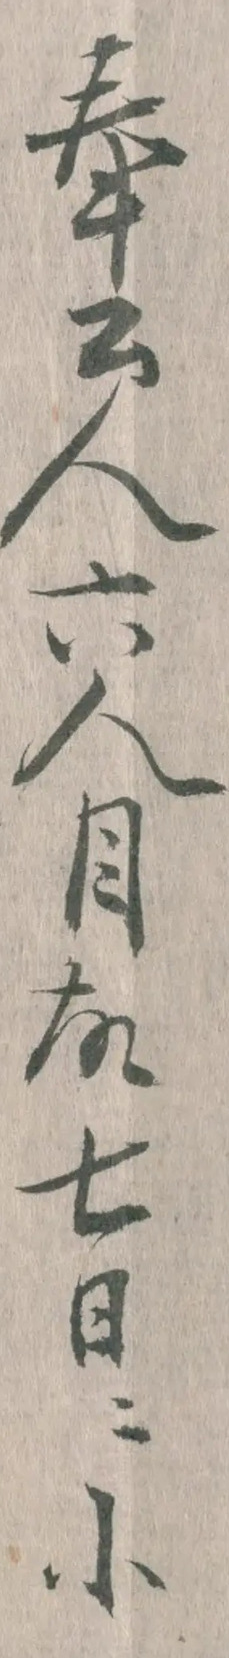奉公人六人目故七日ニ小
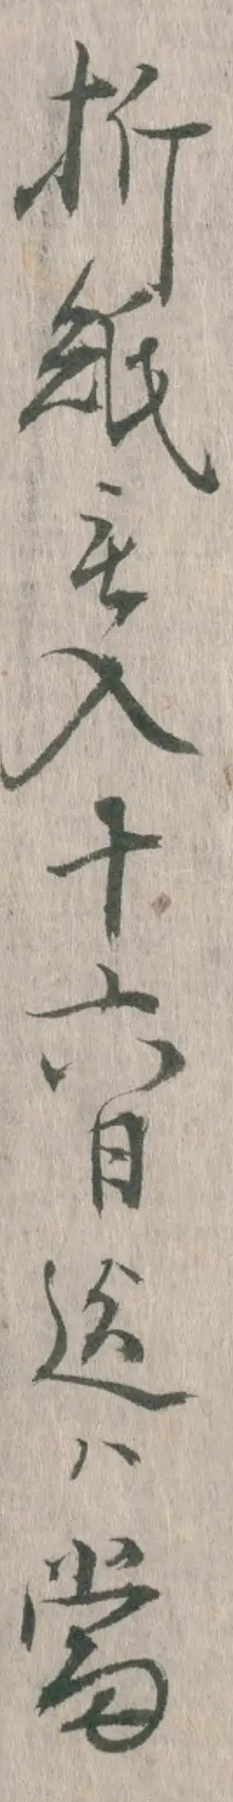折紙被入十六日迄ハ當
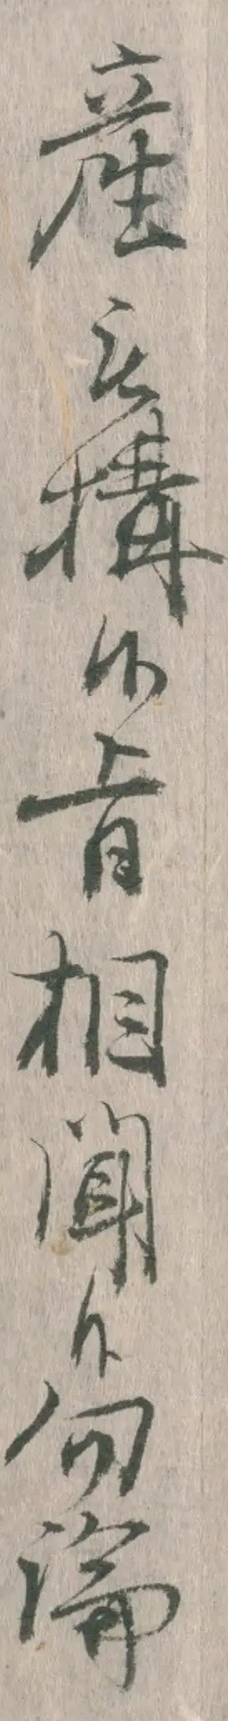産被構候旨相聞候勿論
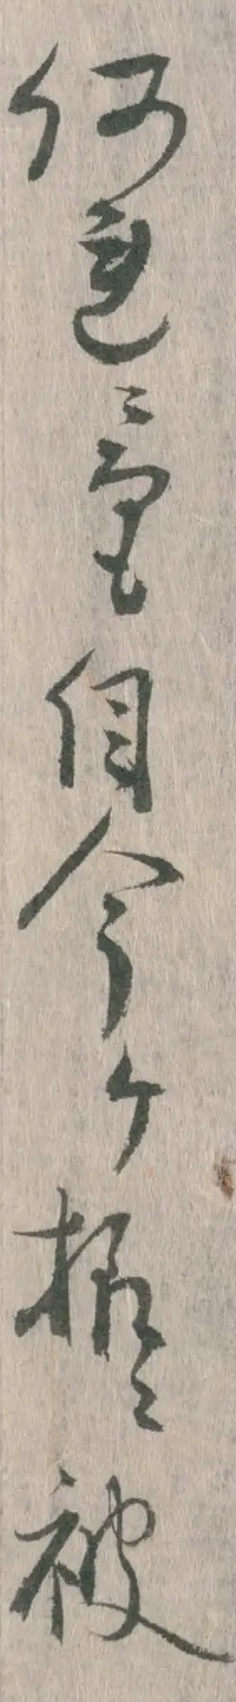何れニ而も自今ケ様に被
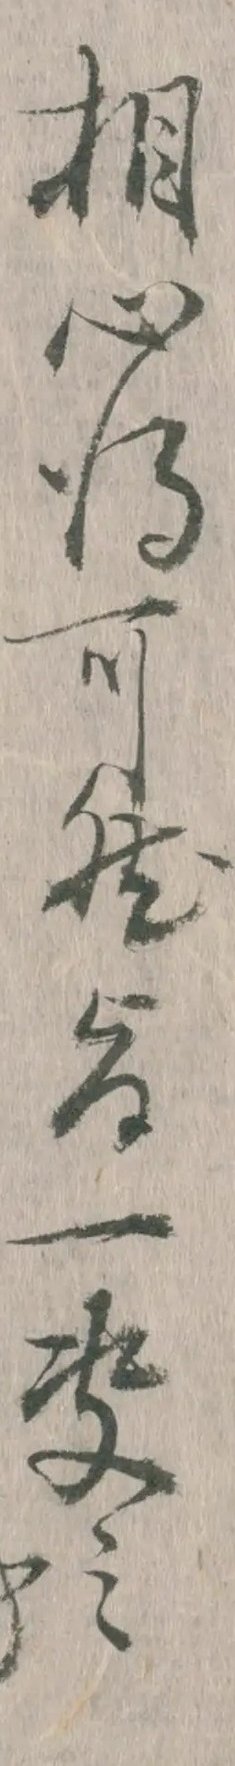相心得可然旨一決之事

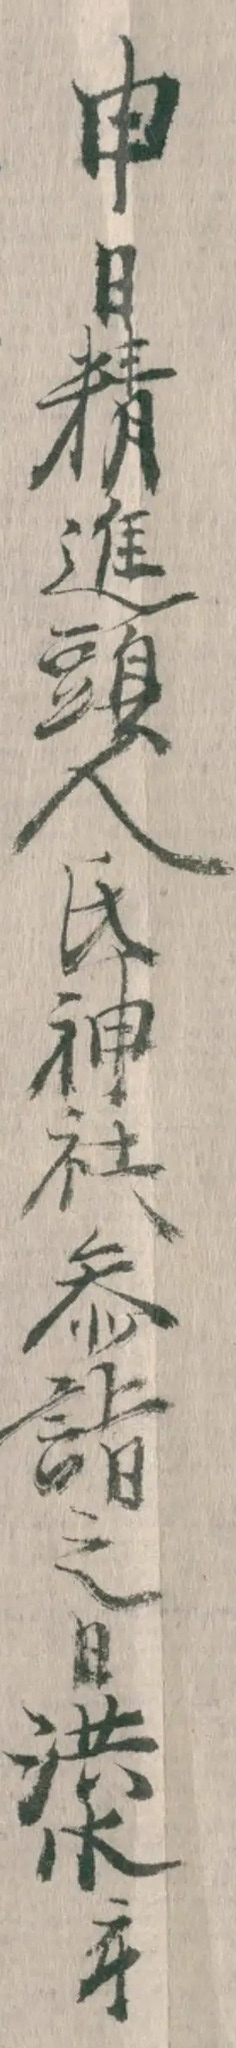申日精進頭人氏神社ヘ参詣之日洪水ニ付
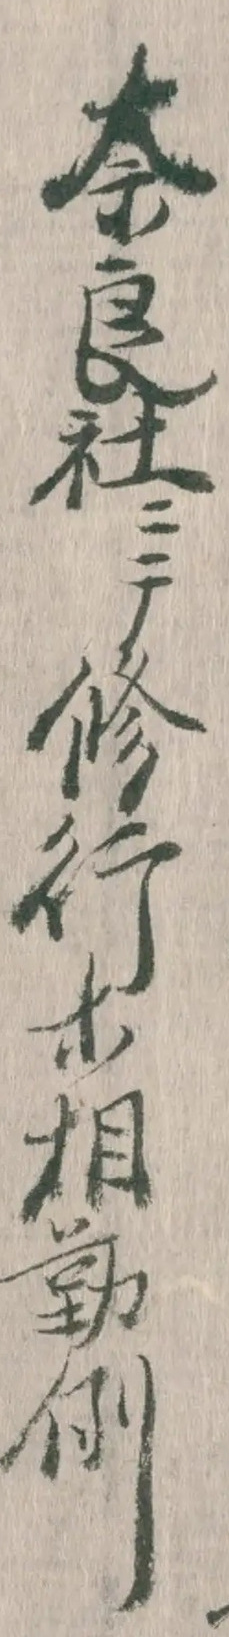奈良社ニテ修行等相勤例
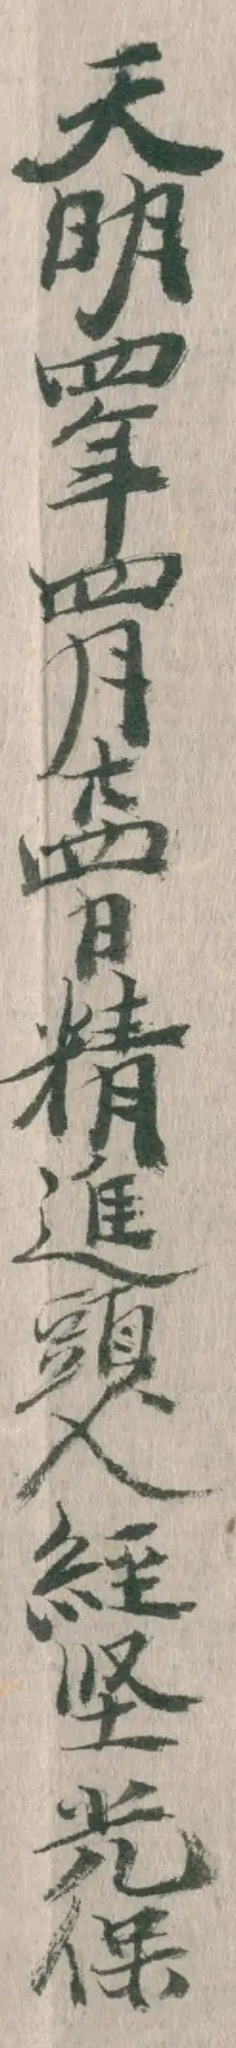天明四年四月廿四日精進頭人経堅光保
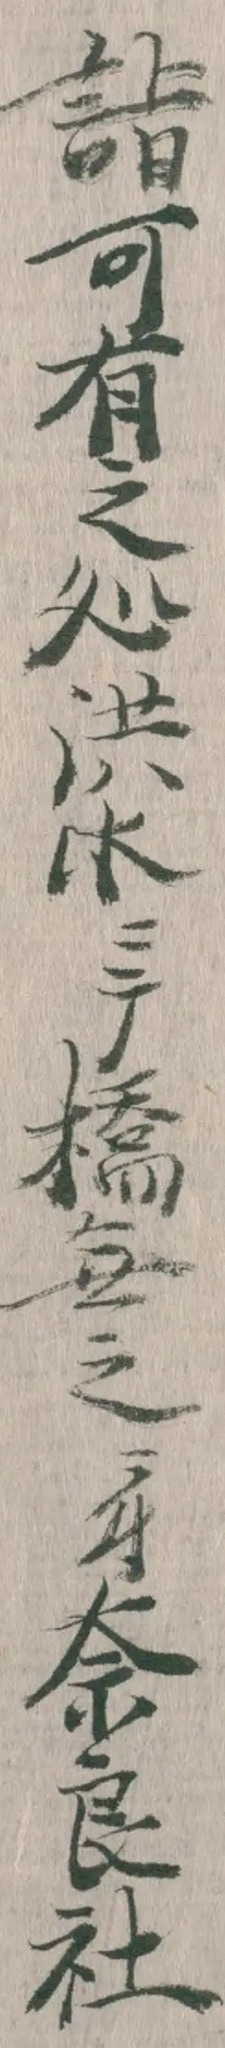詣可有之処洪水ニテ橋無之ニ付奈良社
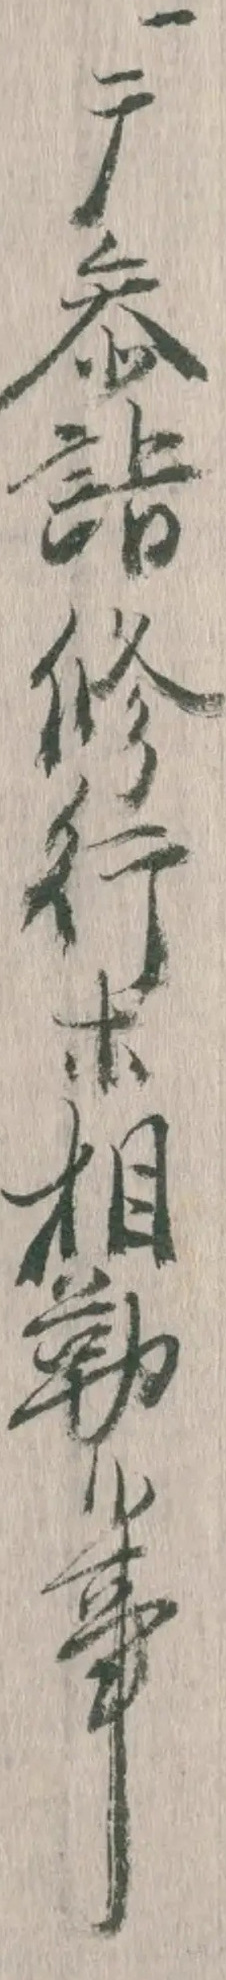ニテ参詣修行等相勤候事
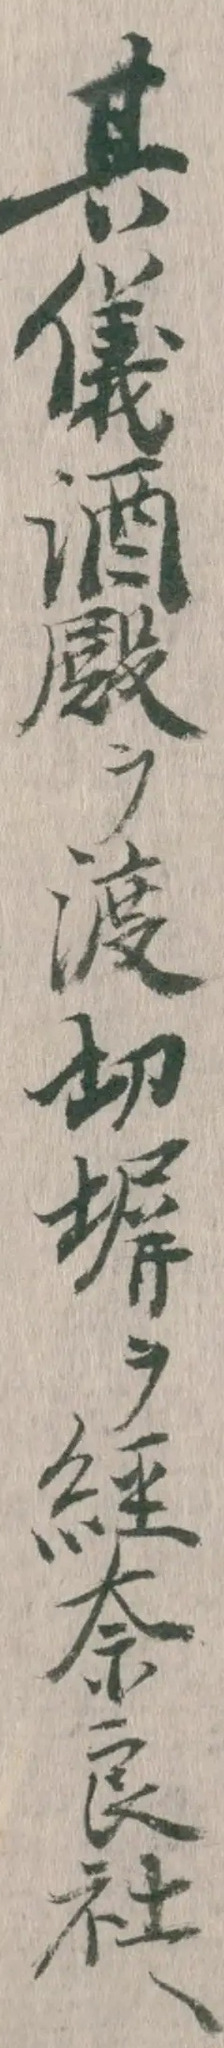其儀酒殿ヲ渡切塀ヲ経奈良社へ
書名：賀茂社記録. 第72冊
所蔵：国立国会図書館 National Diet Library, JAPAN
